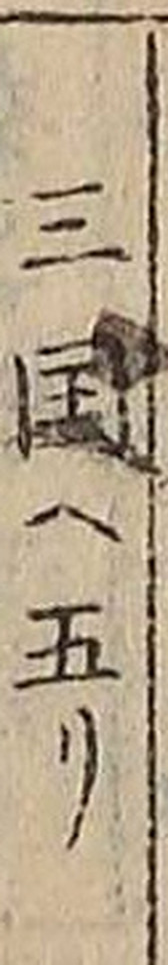三国ヘ五リ
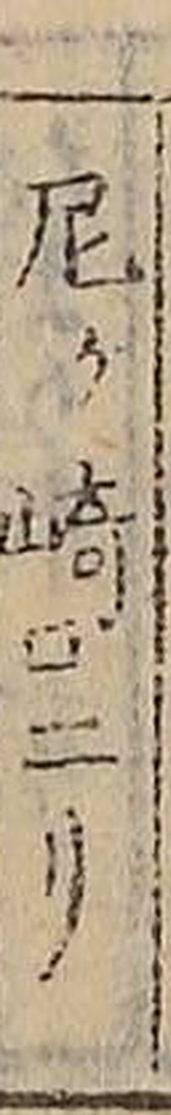尼か崎▫二リ
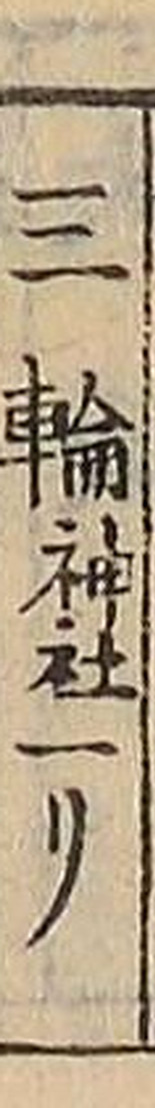三輪神社一リ
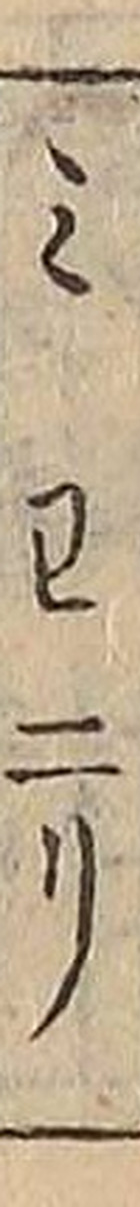みわ二リ
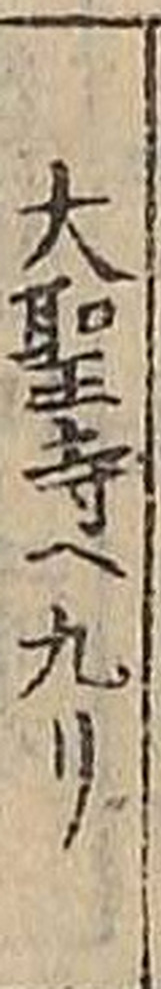大聖寺へ九リ
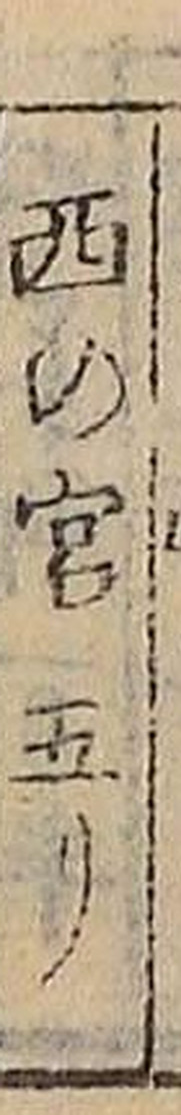西の宮五リ
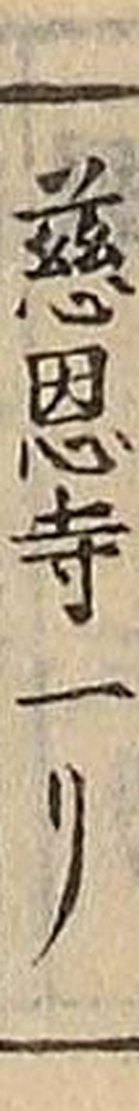慈恩寺一リ
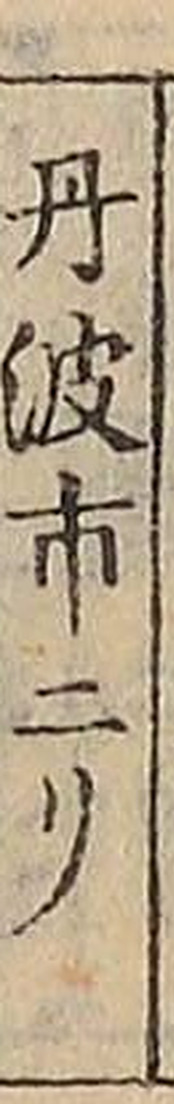丹波市一リ
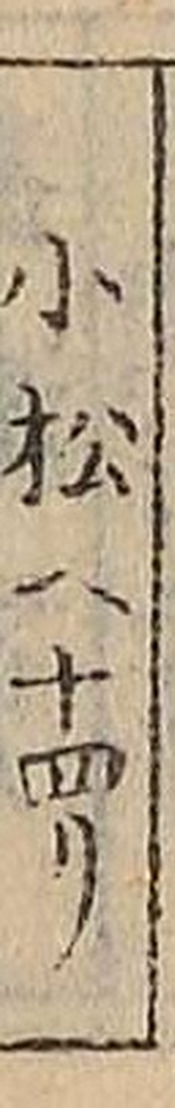小松へ十四リ
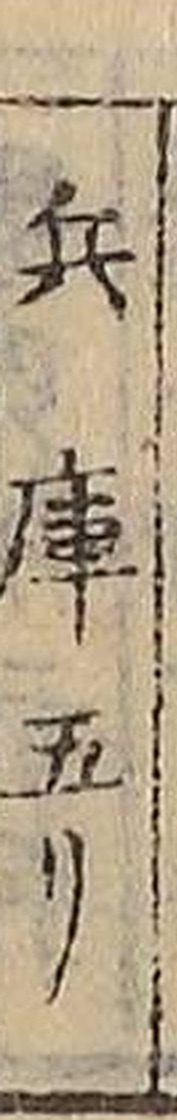兵庫五リ
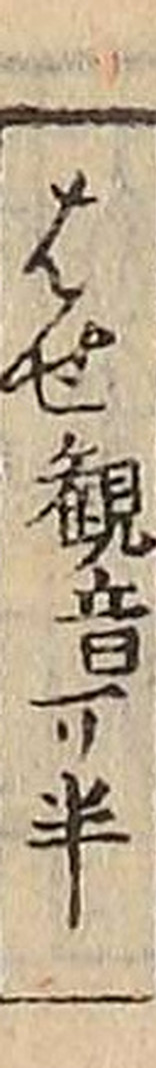はせ観音一リ半
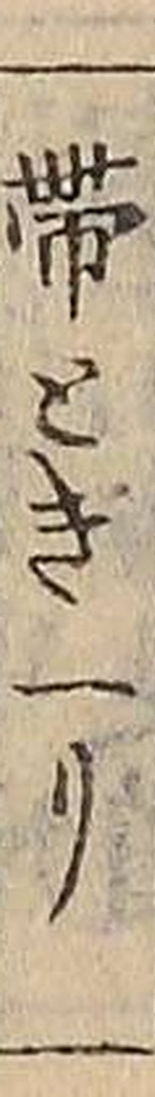帯とき一リ
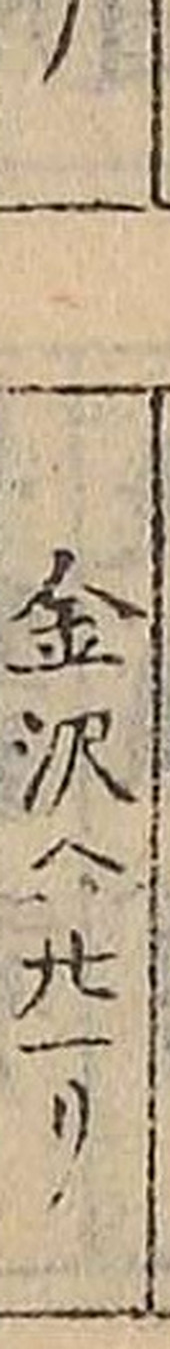金沢へ廿一リ
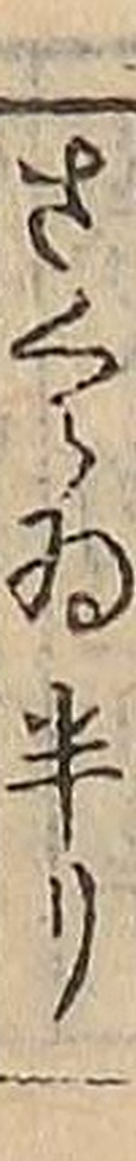さくらゐ半り
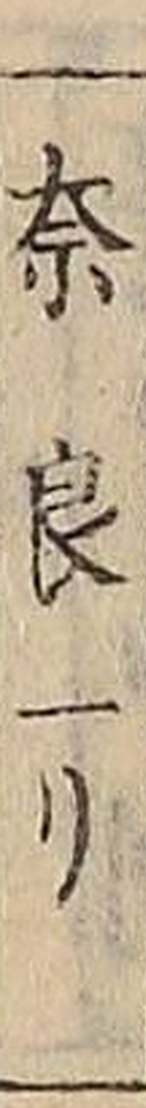奈良一リ
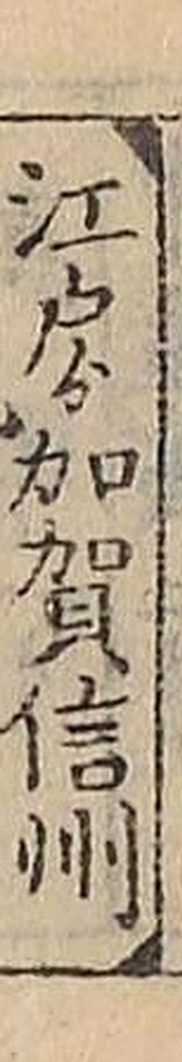江戸ゟ加賀信州
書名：旅行用心集
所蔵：神戸大学附属図書館 国文学研究資料館
